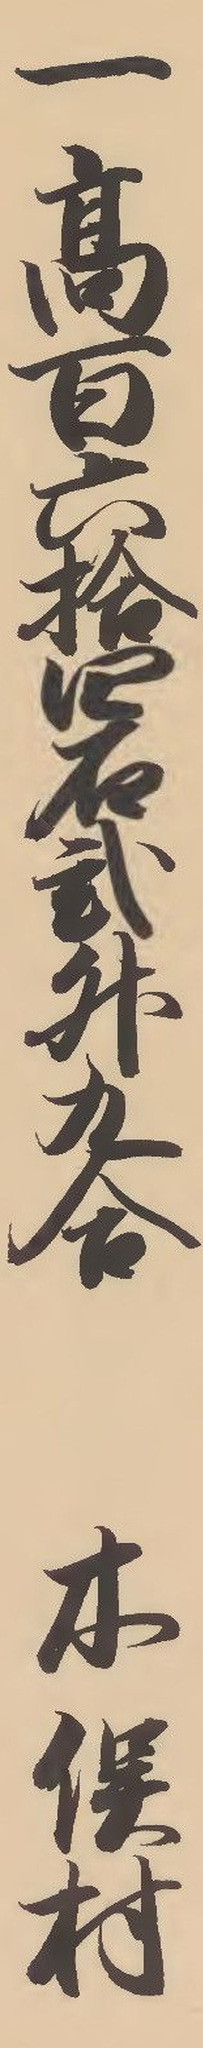一高百六拾四石弐升九合木俣村
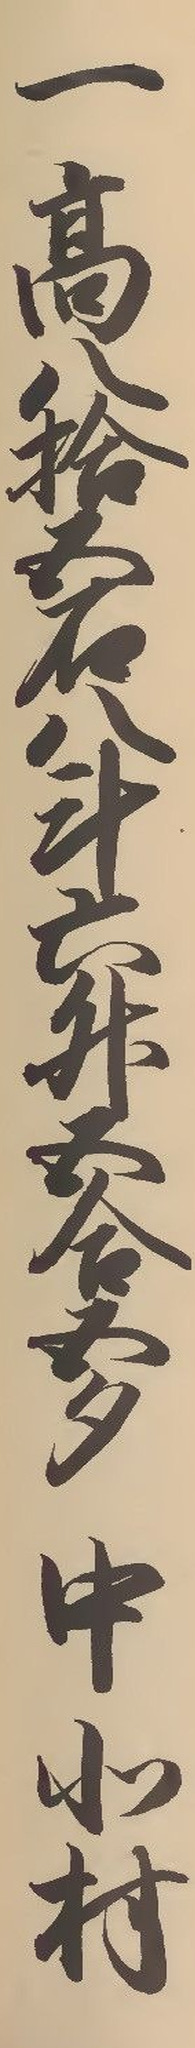一高八拾五石八斗六升五合五勺中北村
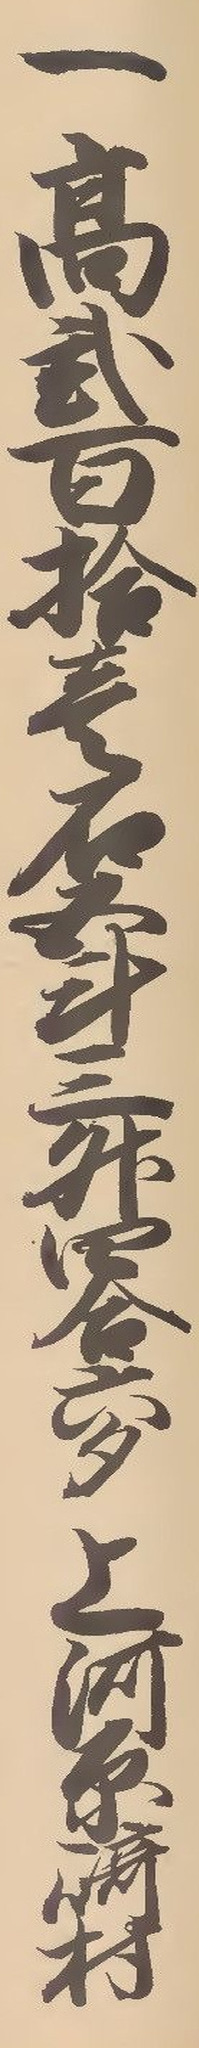一高弐百拾壱石五斗三升四合六勺上河原崎村
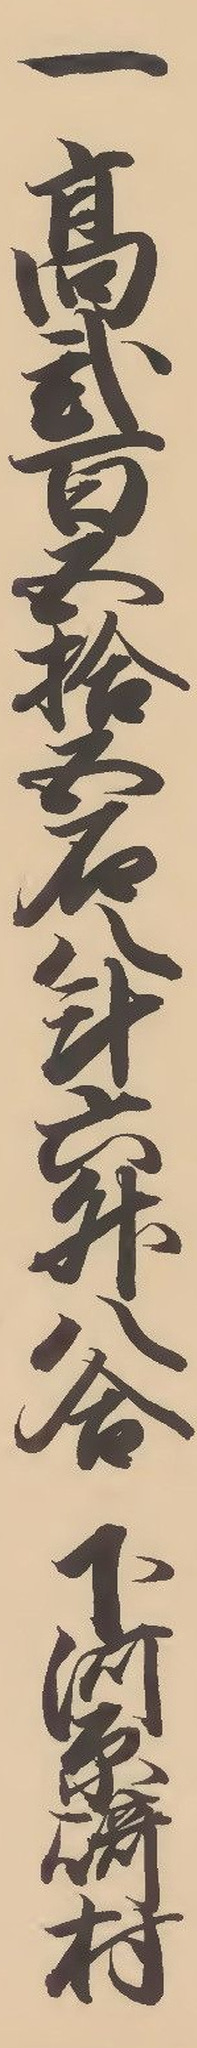一高弐百五拾五石八斗六升八合下河原崎村
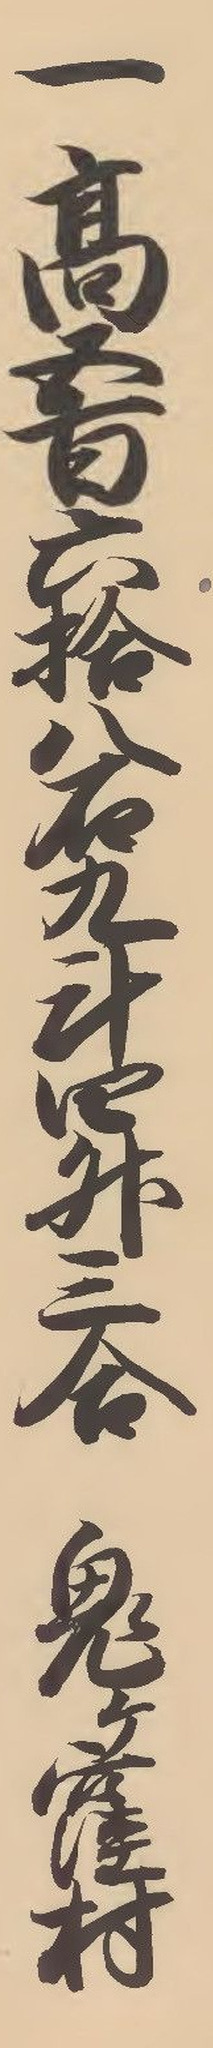一高五百六拾八石九斗四升三合鬼ヶ窪村
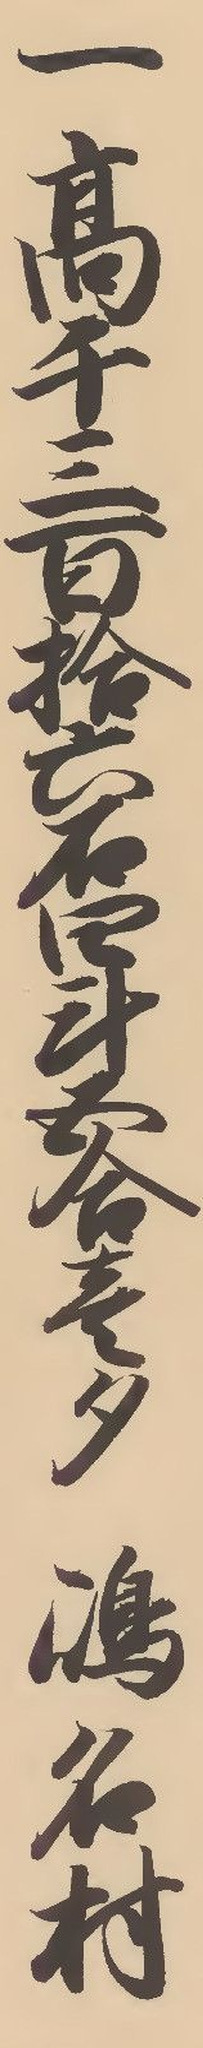一高千三百拾六石四斗五合壱勺島名村

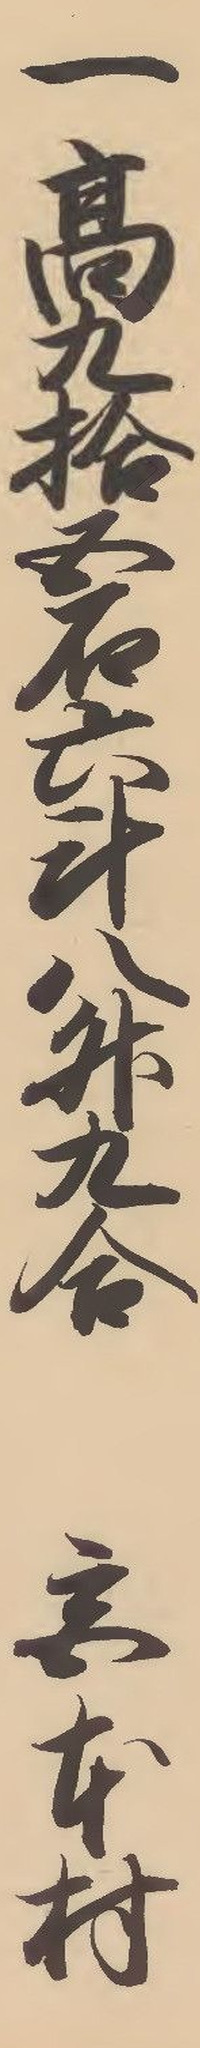一高九拾五石六斗八升九合宮本村
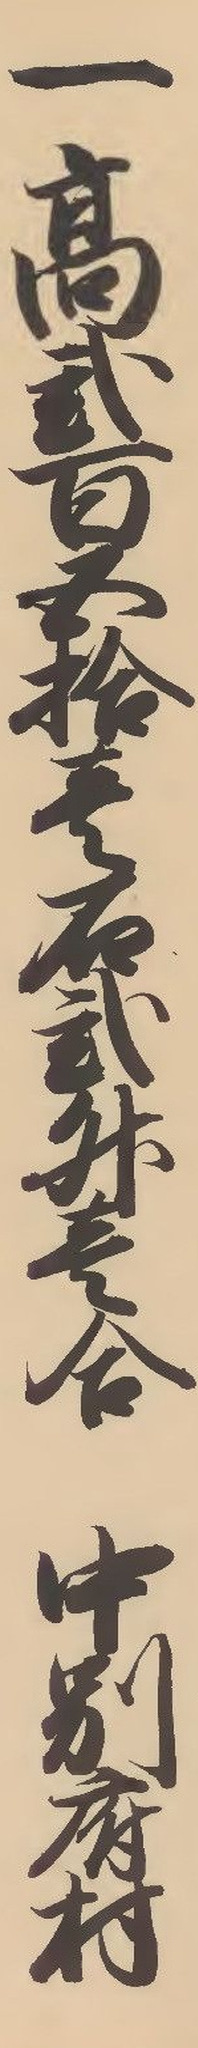一高弐百五拾壱石弐升壱合中別府村
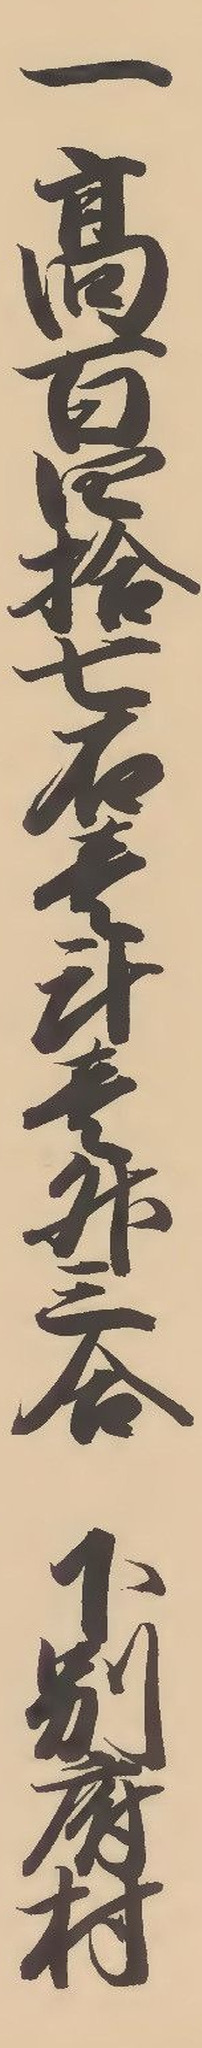一高百四拾七石壱斗壱升三合下別府村
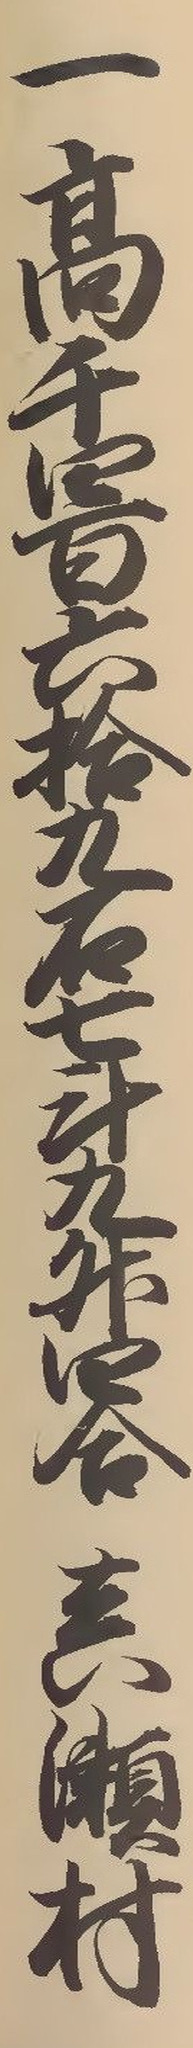一高千四百六拾九石七斗九升四合真瀬村
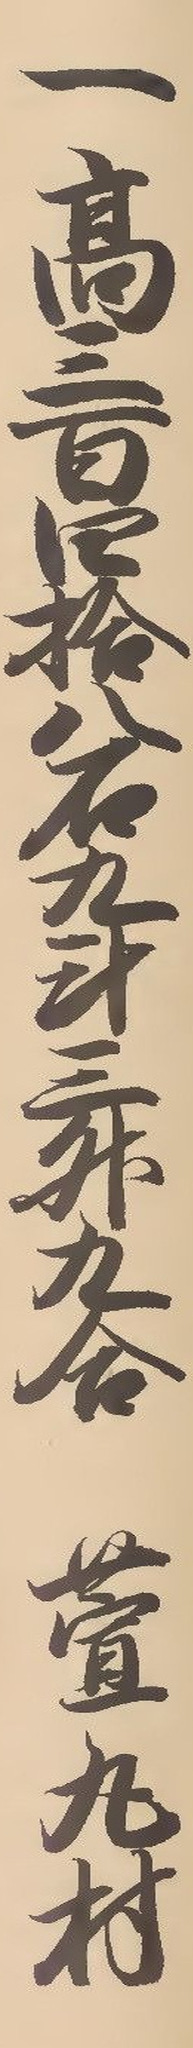一高三百四拾八石九斗三升九合萱丸村
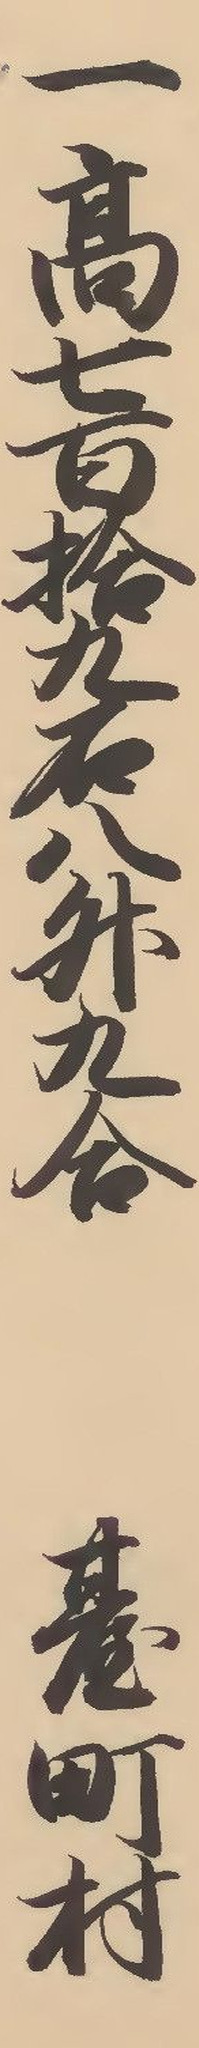一高七百拾九石八升九合台町村
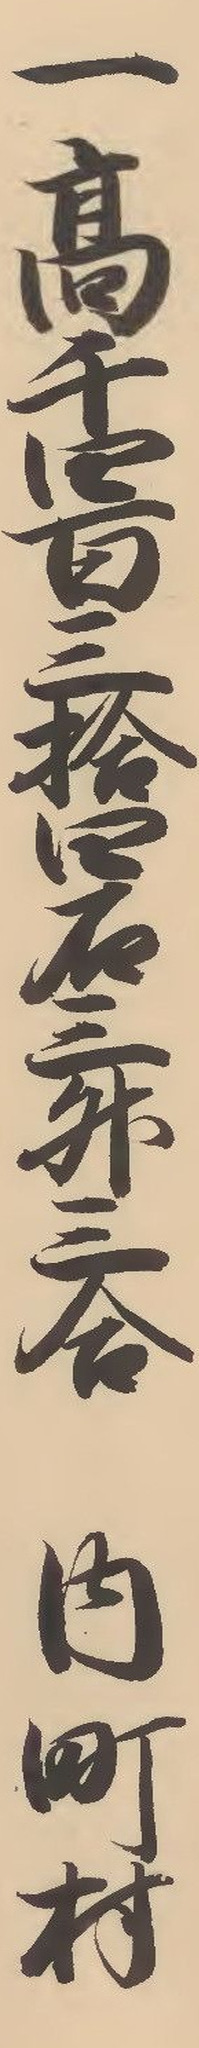一高千四百三拾四石三升三合内町村
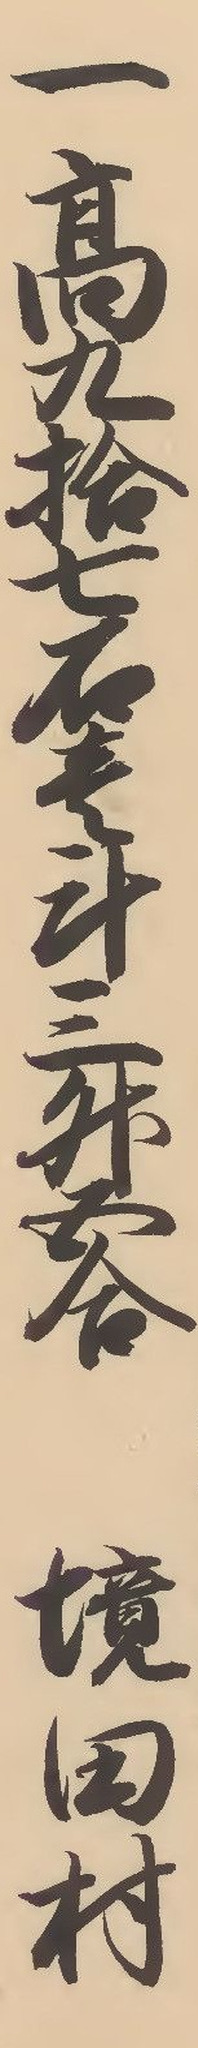一高九拾七石壱斗三升五合境田村

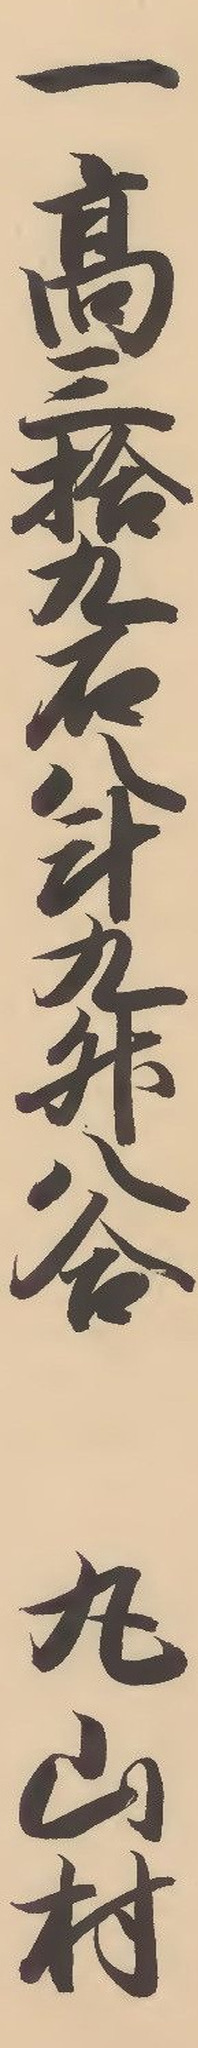一高三拾九石八斗九升八合丸山村
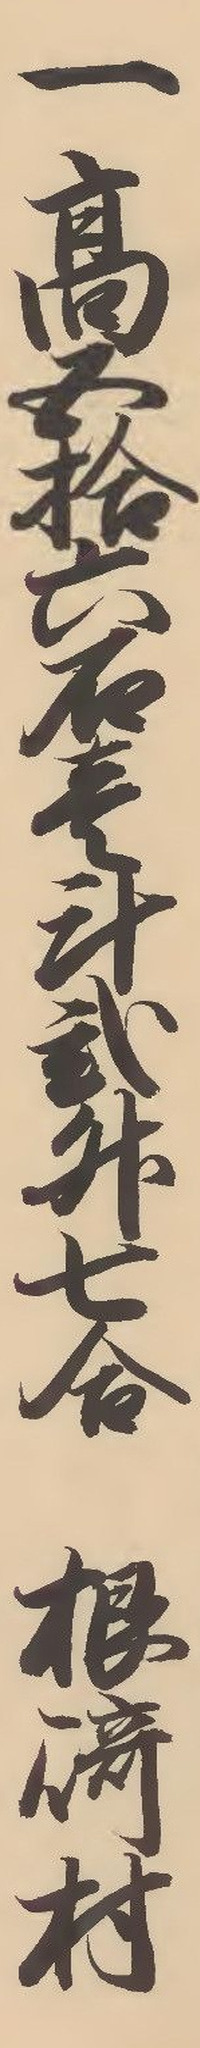一高五拾六石壱斗弐升七合根崎村
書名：常陸国郷帳
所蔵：国立公文書館 National Archives of Japan
